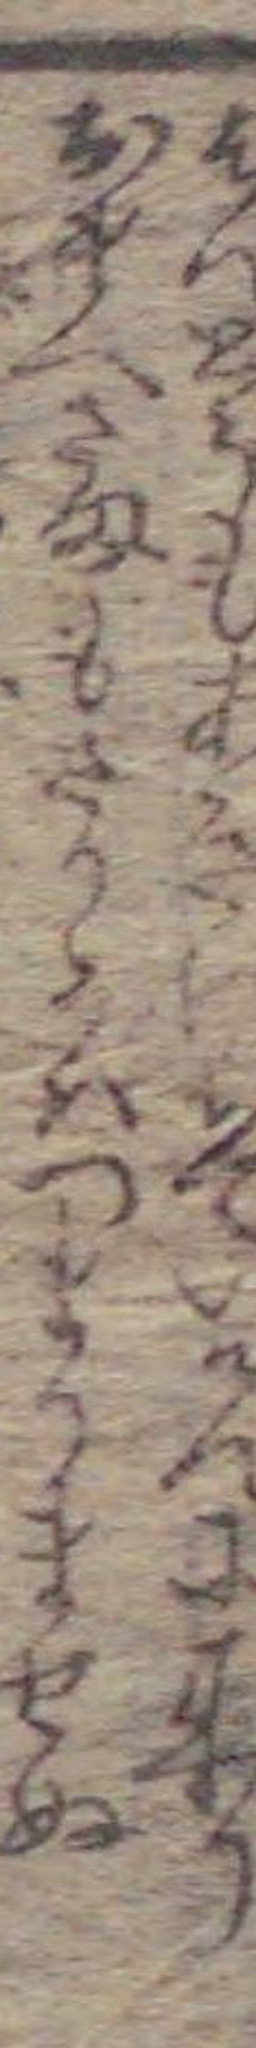おまへさまもさりとはつまりませぬ
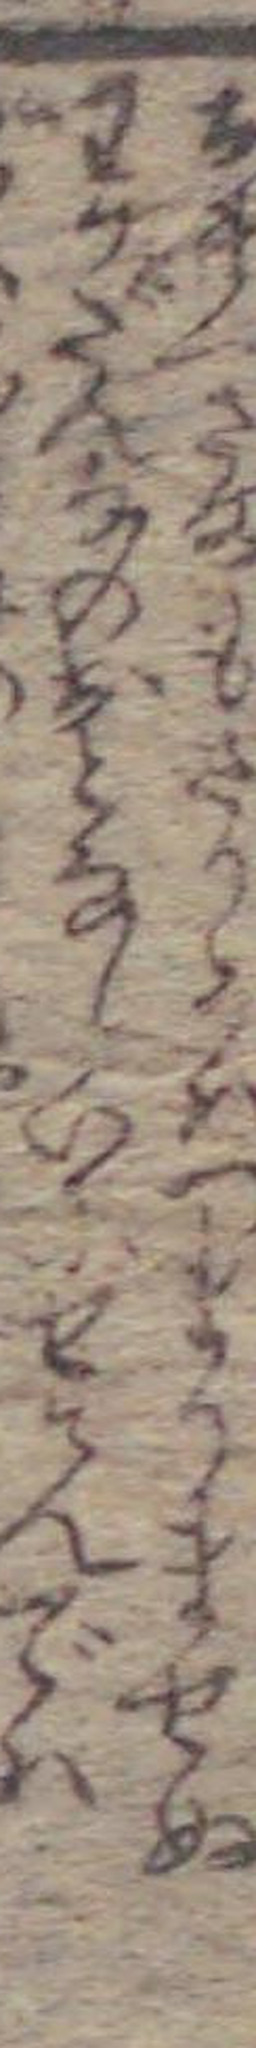わかだんなのおとなしいにせけんでは
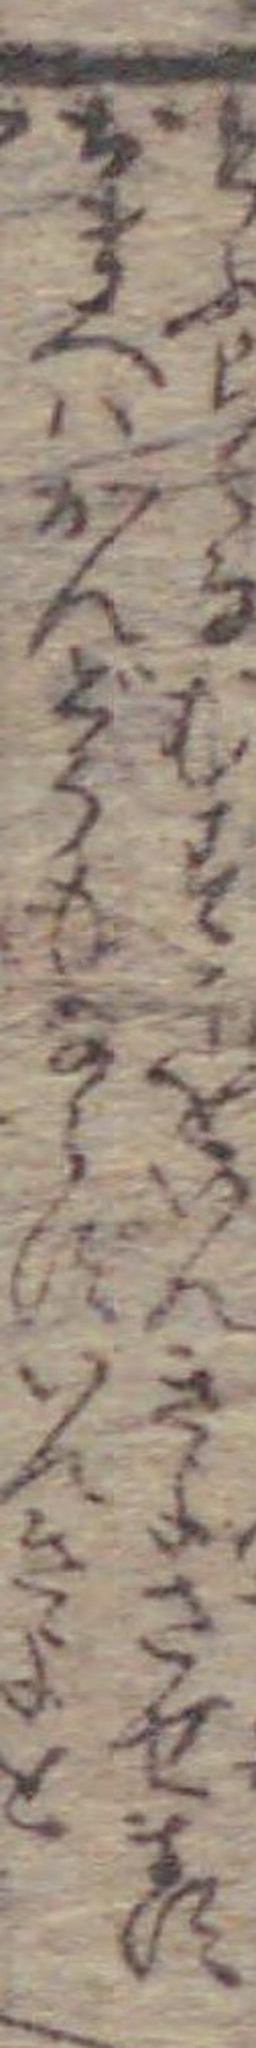おまへはかんどうもならずいんきよを
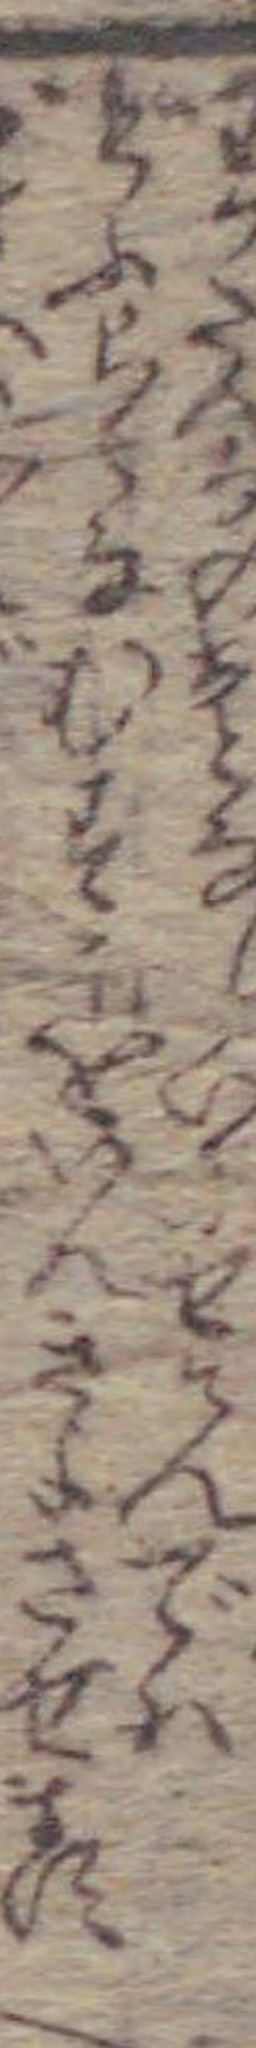どふらくなむすこをいんきよさせます
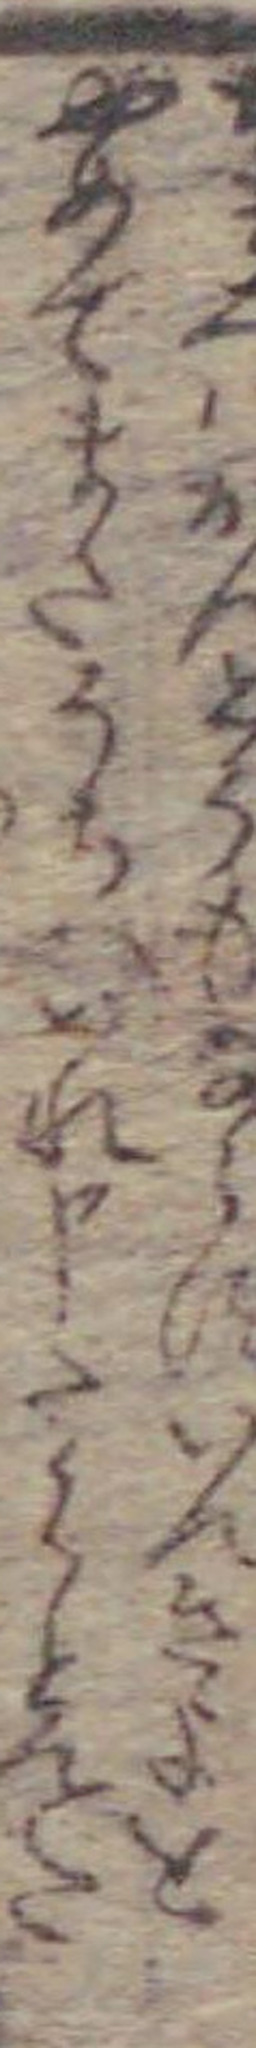やめてまたうちへいれ申たらとんた
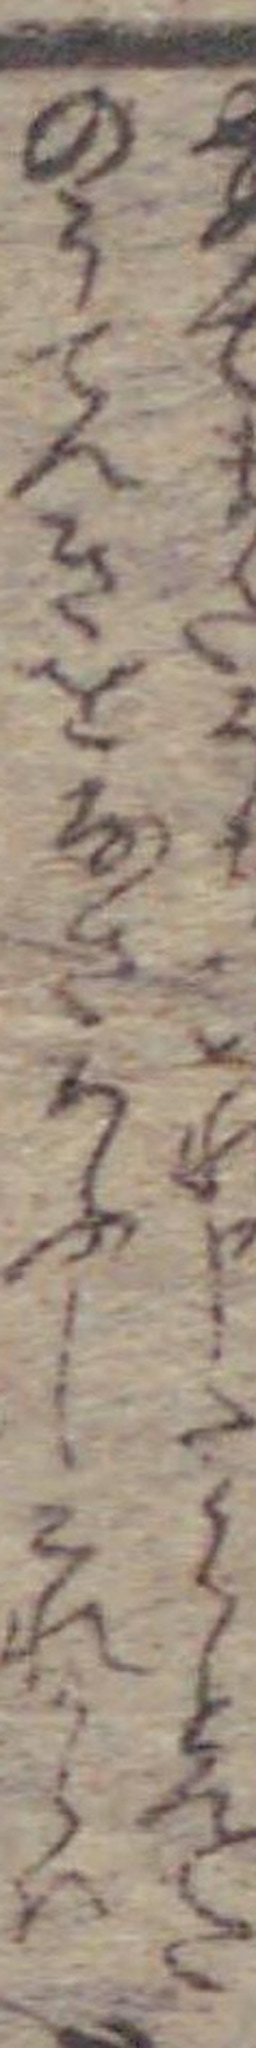のうてんきをなさろふしこれからは
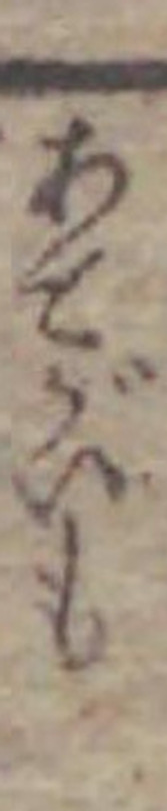あてがいも
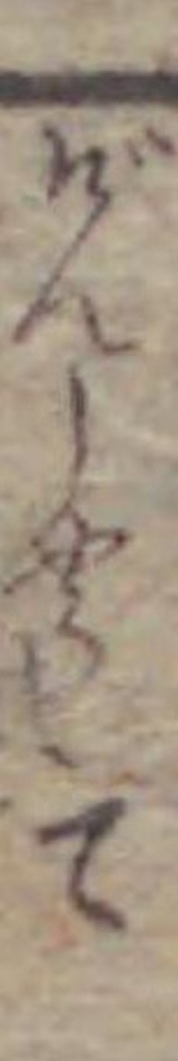げんしやうして
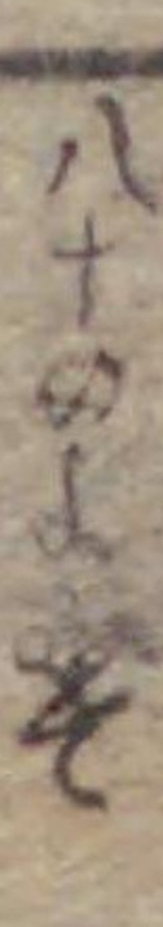八十のよて
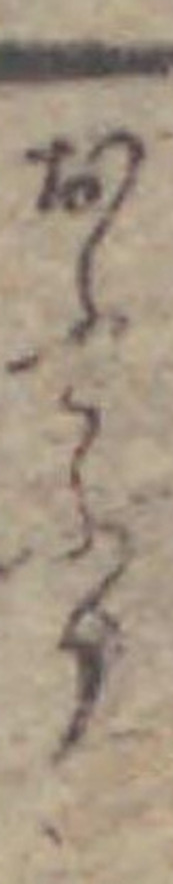おふかぶり
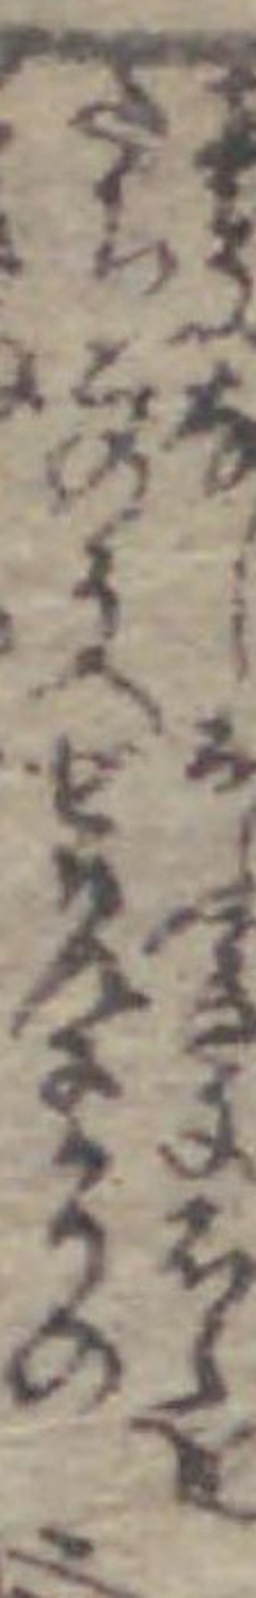たちこのうへせけんにかりの
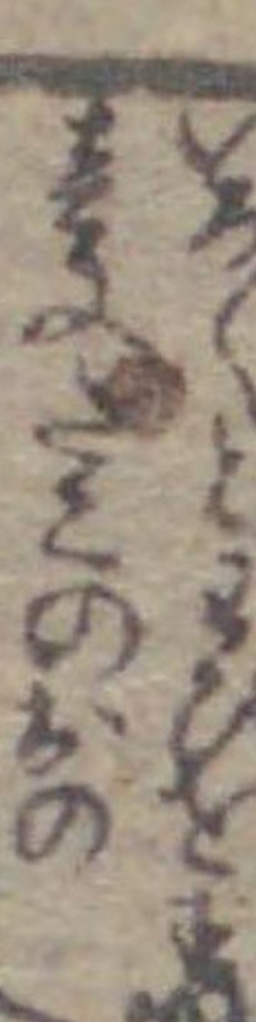壱文たこのおの
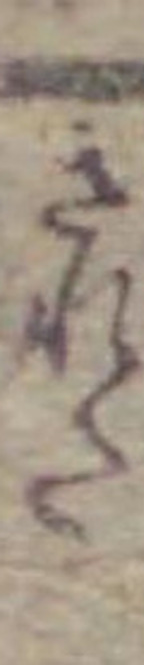きれた
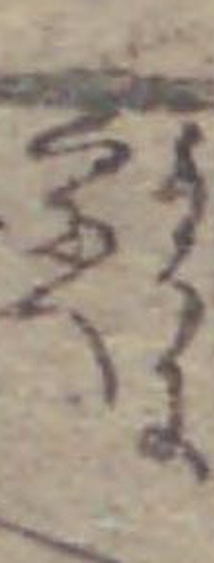くにへ

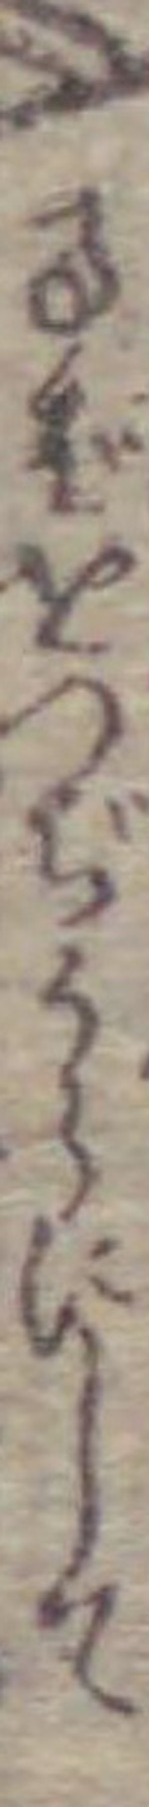事ばをつぢうらにして
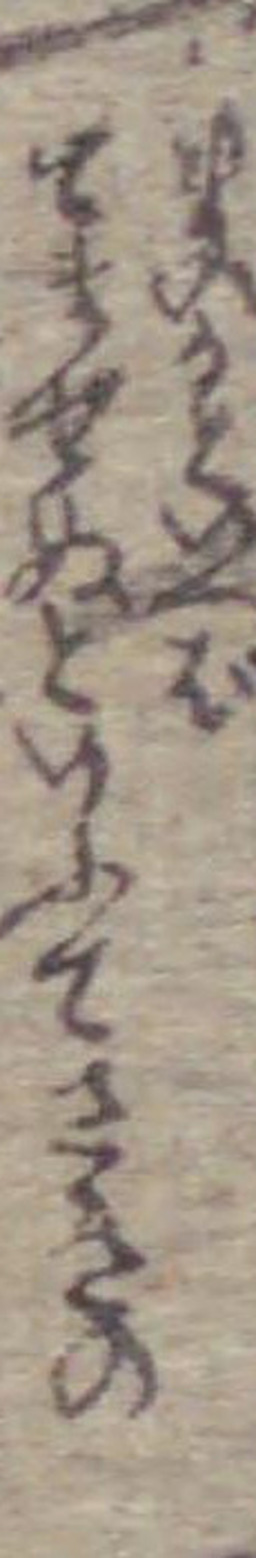てませぬといふてさきの
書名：見通占 : 3巻
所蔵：国立国会図書館 National Diet Library, JAPAN
